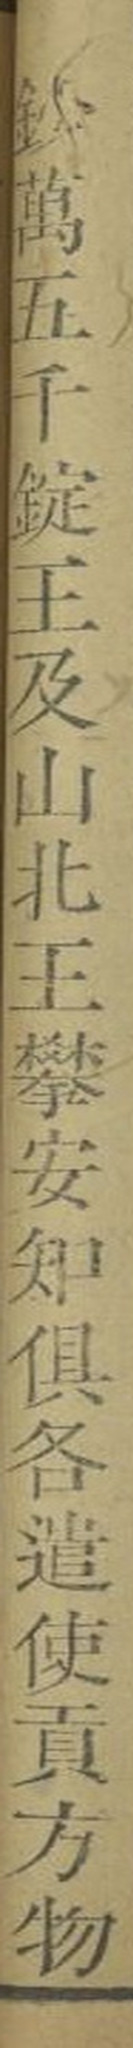鈔万五千錠王及山北王攀安知俱各遣使貢方物
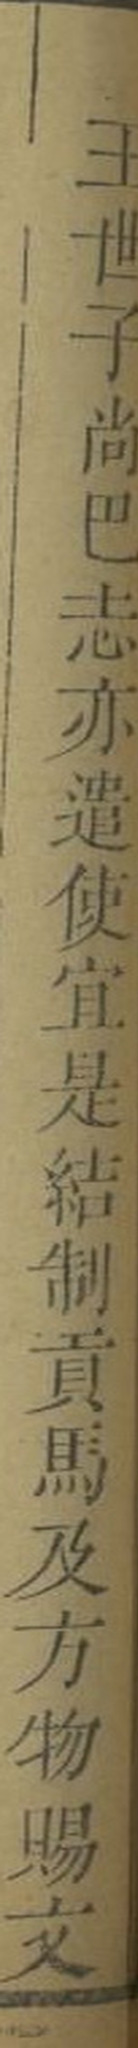王世子尚巴志亦遣使宜是結制貢馬及方物賜文
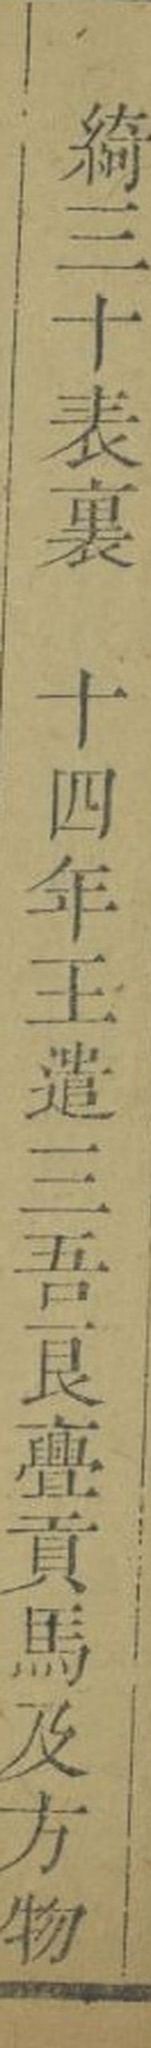綺三十表裏十四年王遣三吾良亹貢馬及方物
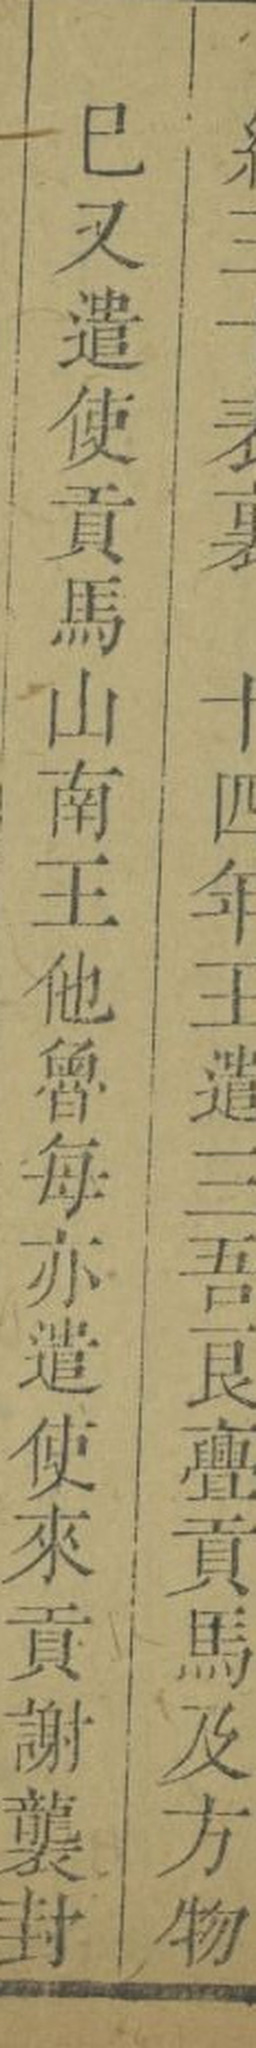巳又遣使貢馬山南王他魯毎亦遣使来貢謝襲封
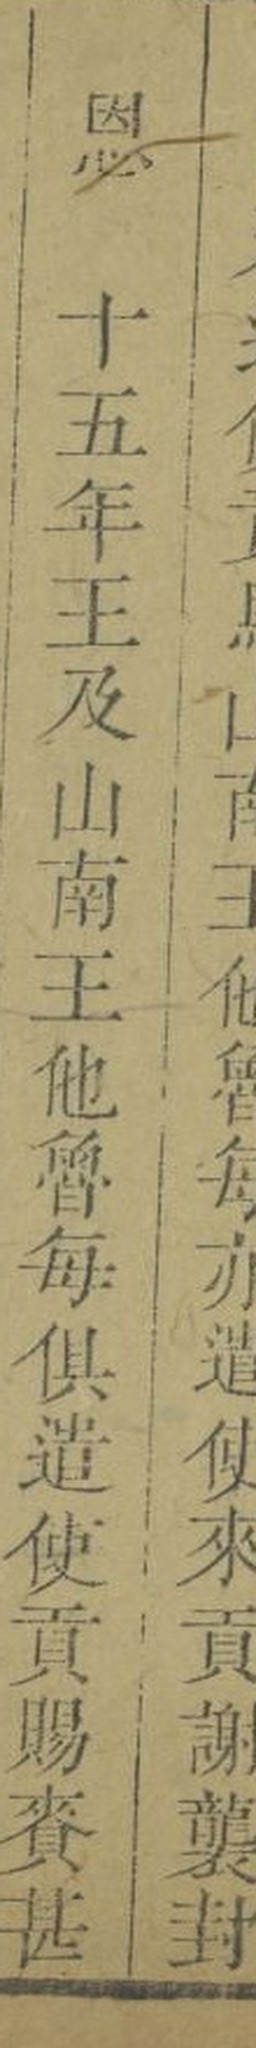恩十五年王及山南王他魯毎俱遣使貢賜賚甚
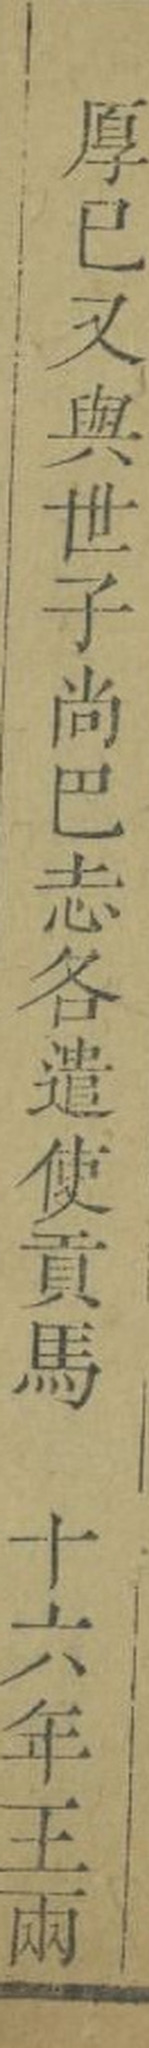厚巳又与世子尚巴志各遣使貢馬十六年王両
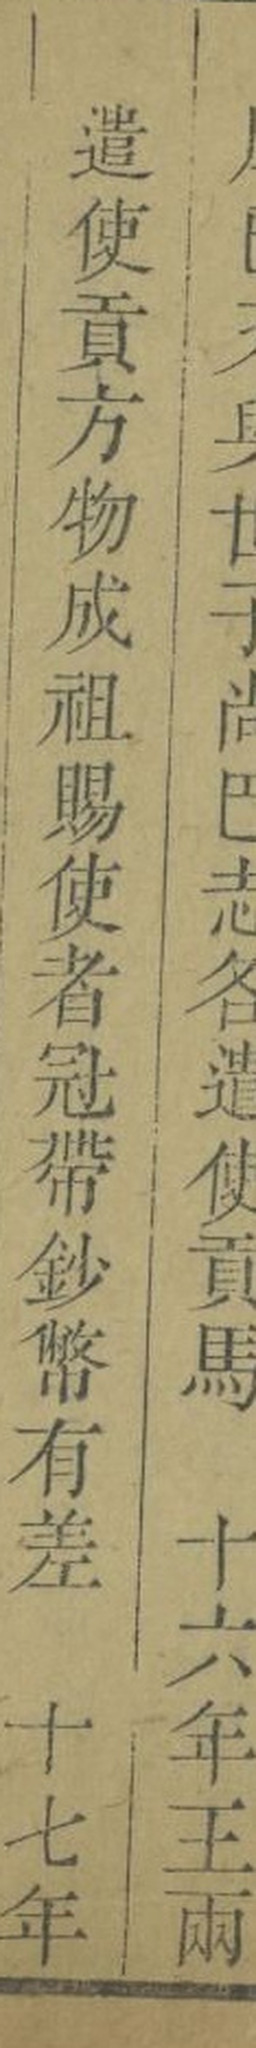遣使貢方物成祖賜使者冠帯鈔幣有差十七年
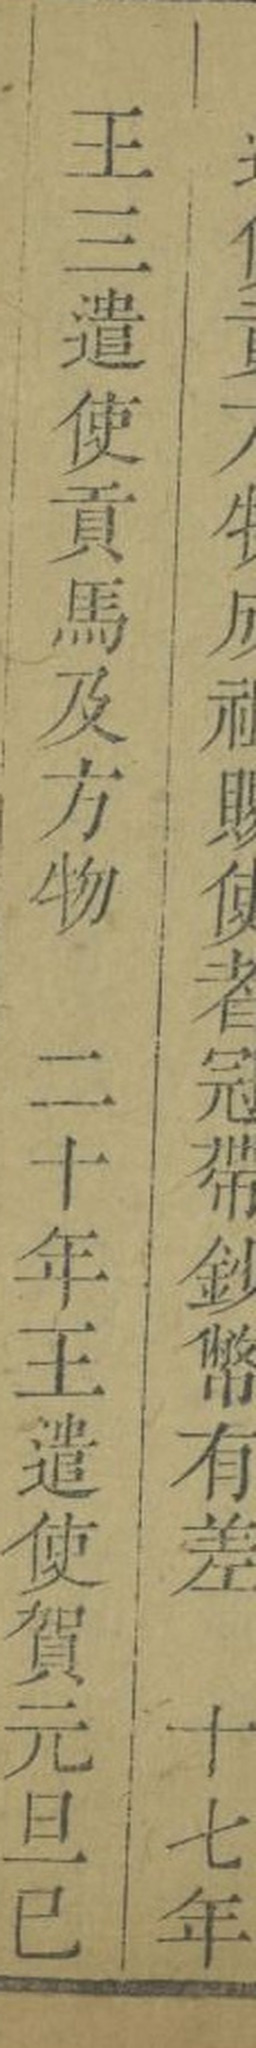王三遣使貢馬及方物二十年王遣使賀元旦巳
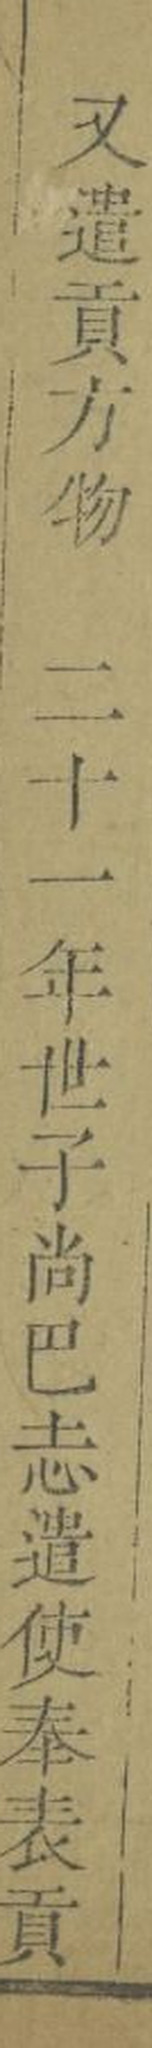又遣貢方物二十一年世子尚巴志遣使奉表貢
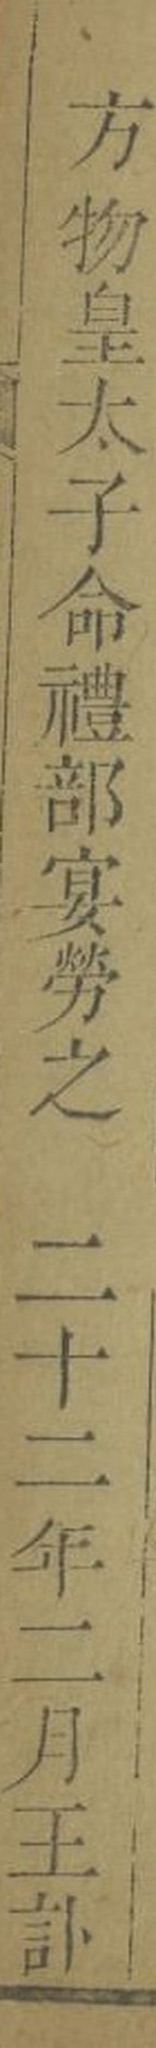方物皇太子命礼部宴労之二十二年二月王訃

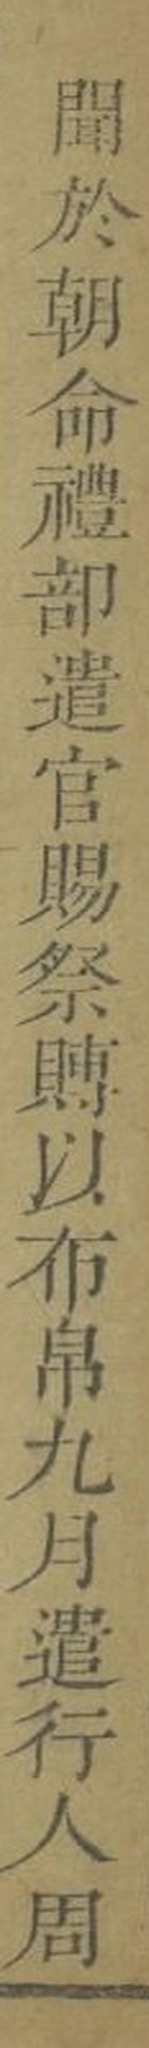聞於朝命礼部遣官賜祭賻以布帛九月遣行人周
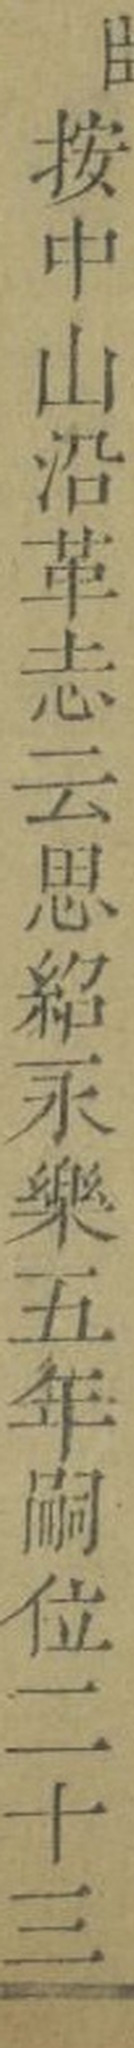臣按中山沿革志云思紹永楽五年嗣位二十三
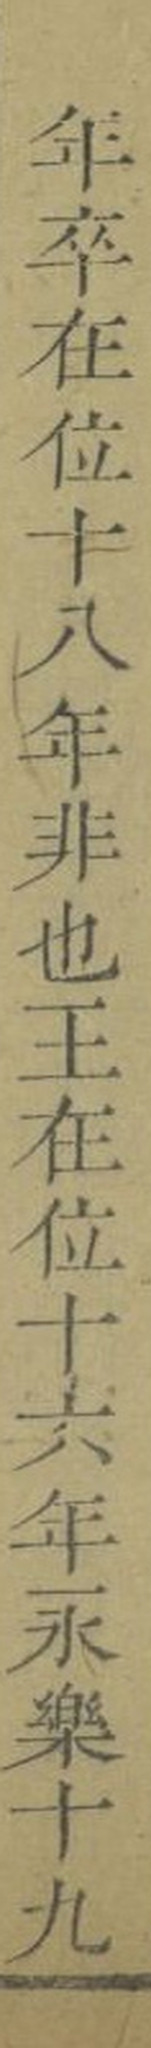年卒在位十八年非也王在位十六年永楽十九
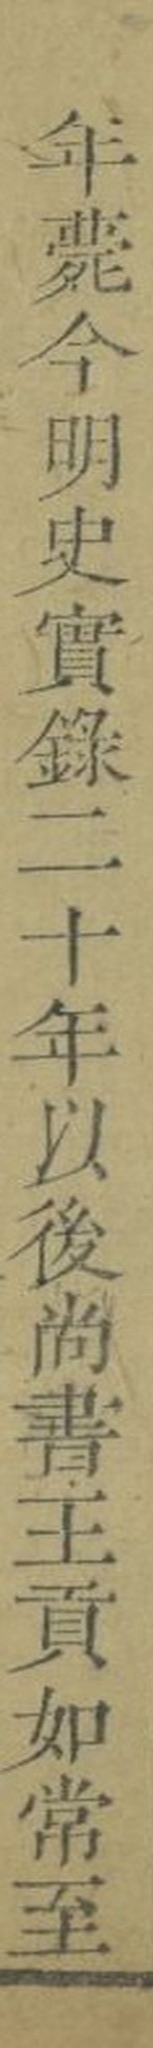年薨今明史実録二十年以後尚書王貢如常至
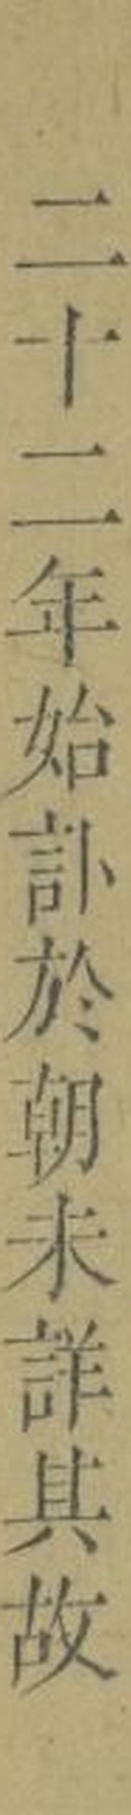二十二年始訃於朝未詳其故
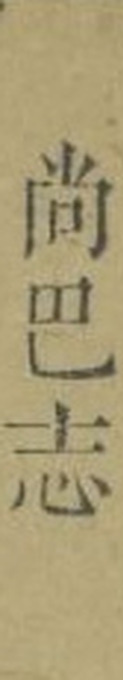尚巴志
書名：中山伝信録 巻三
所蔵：University of the Ryukyus Library
